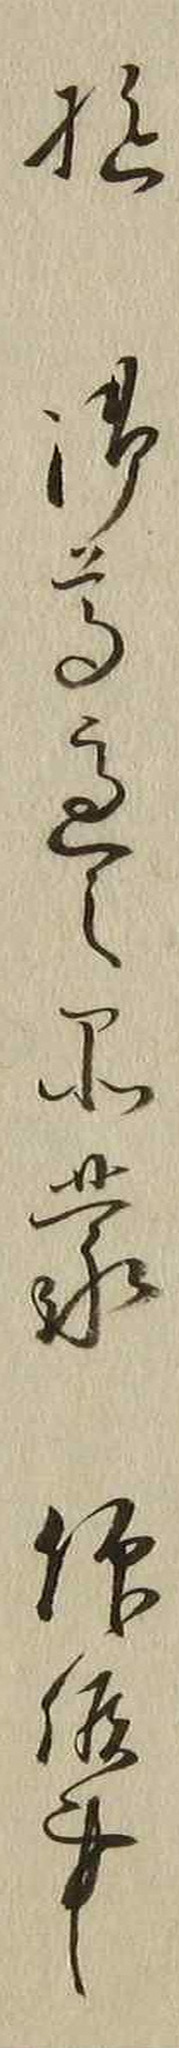遊御尊慮之品蒙仰候事
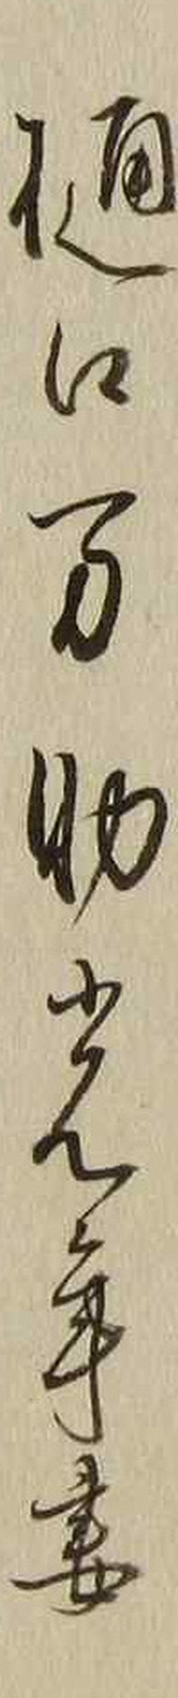樋口万助光年妻
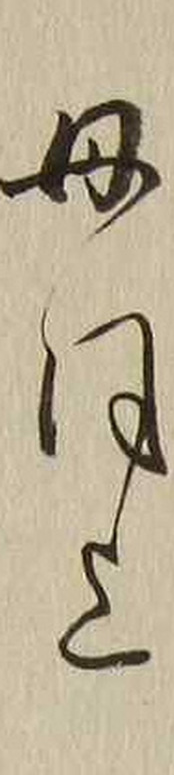母同上
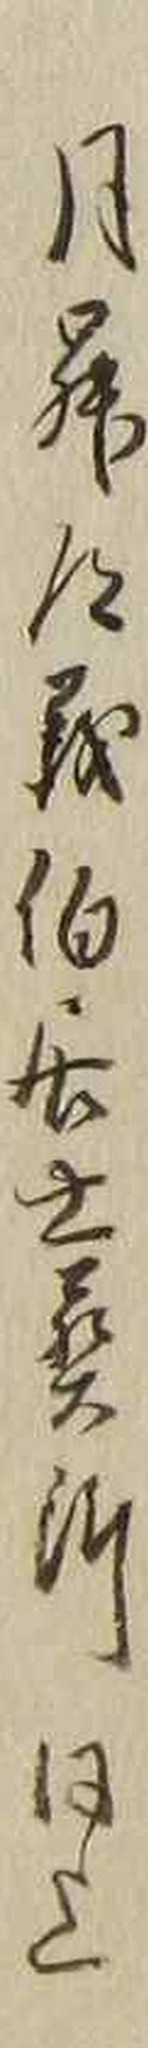月昇常越伯居士葬所同上
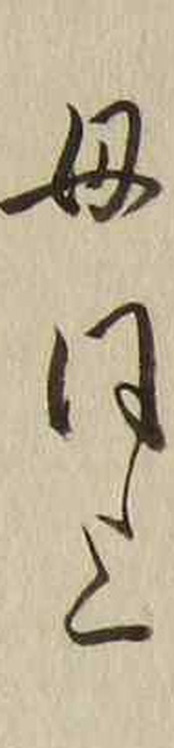母同上

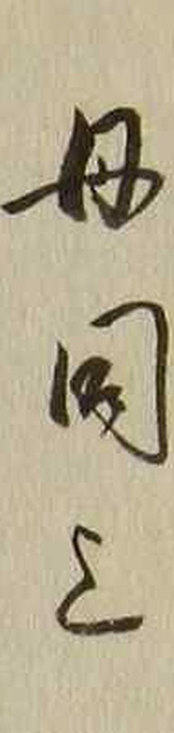母同上
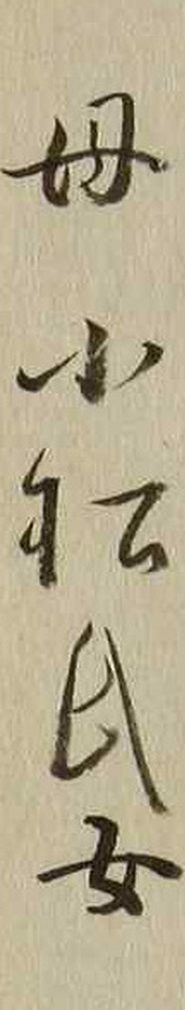母小松氏女
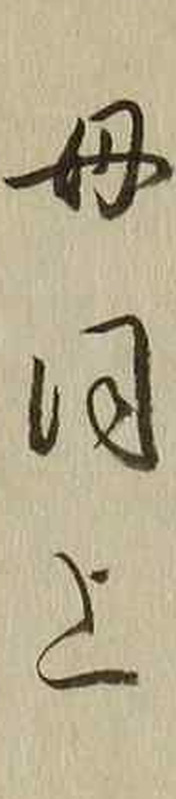母同上
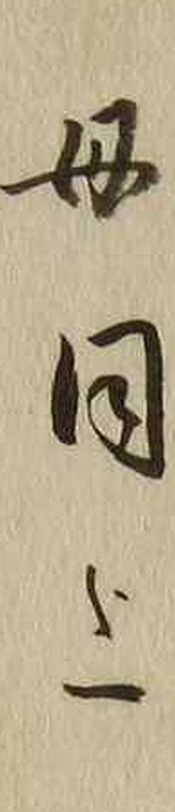母同上
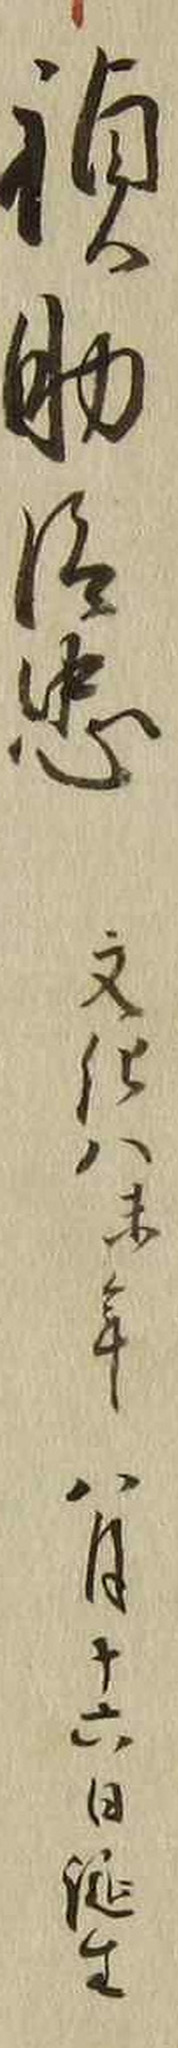禎助信忠文化八未年八月十六日誕生
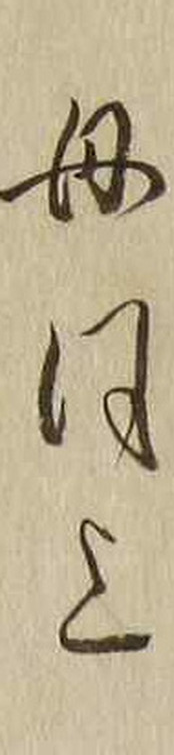母同上
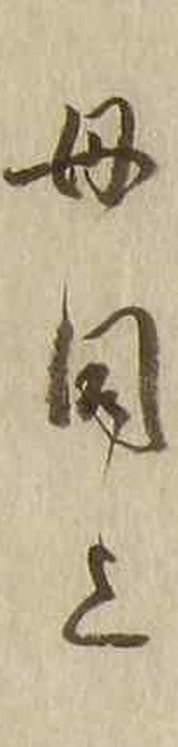母同上
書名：諸士系譜　巻之68　を之部2
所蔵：会津若松市立会津図書館
